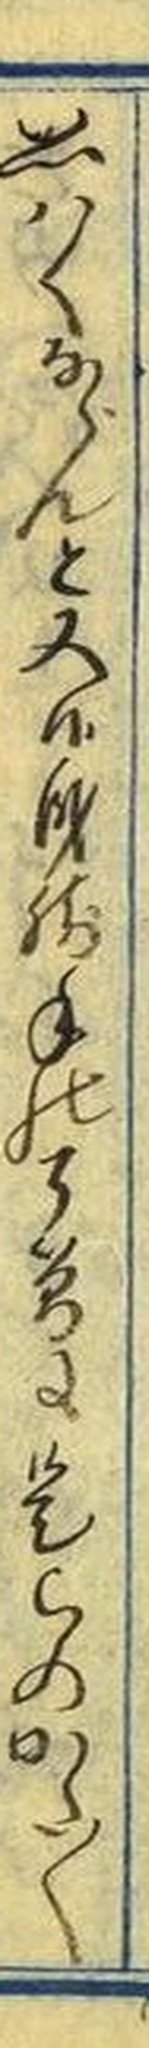思はくならんと又候身勝手の了簡に是らのかた〳〵

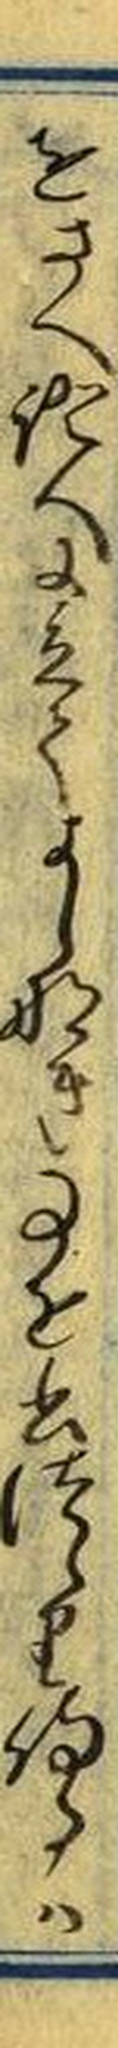をさへ証人に立てよしなき事を書つゝり侍るは
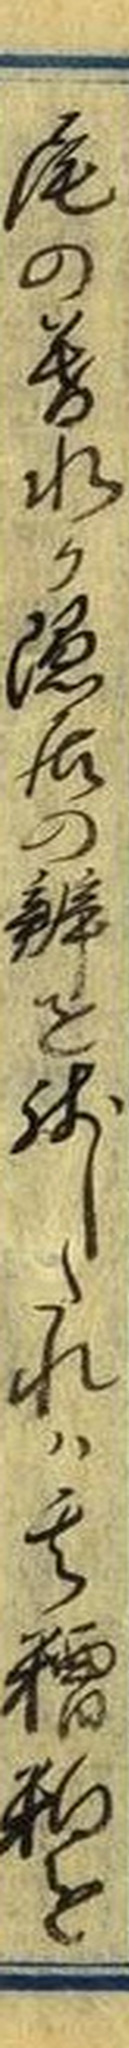尾の暮れか隠居の弁を残したれは其糟粕を
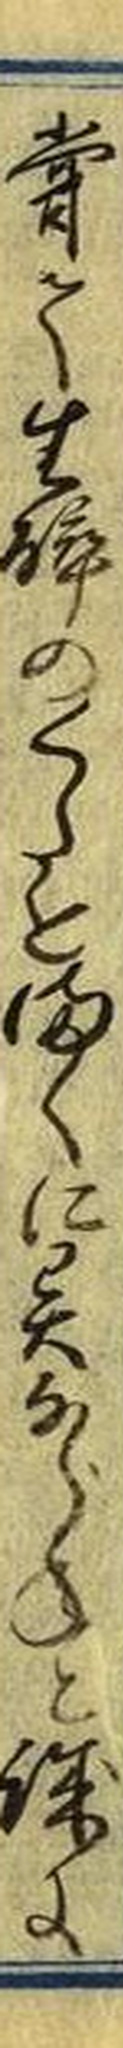嘗て生酔のくたをまくに異ならねと誠に
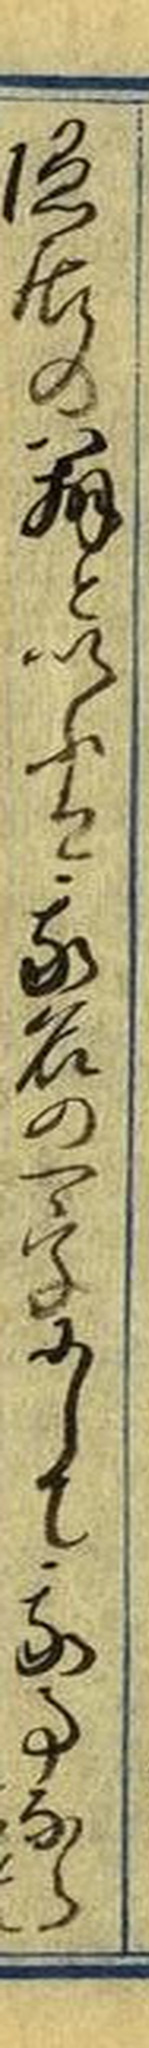隠居の翁といふは我名の一字にして我事なるとそ
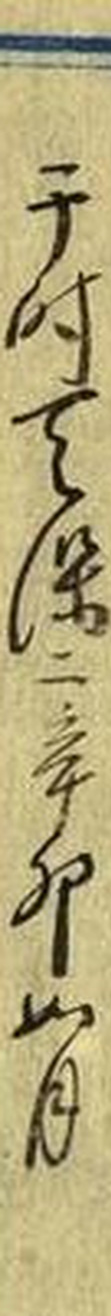于時天保二辛卯如月
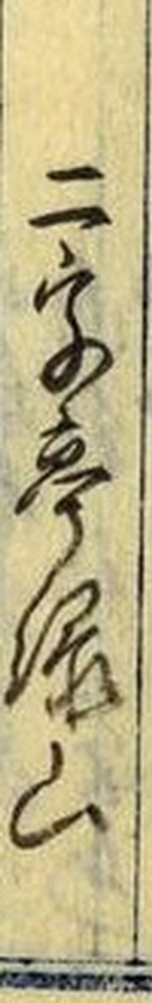二字亭緑山
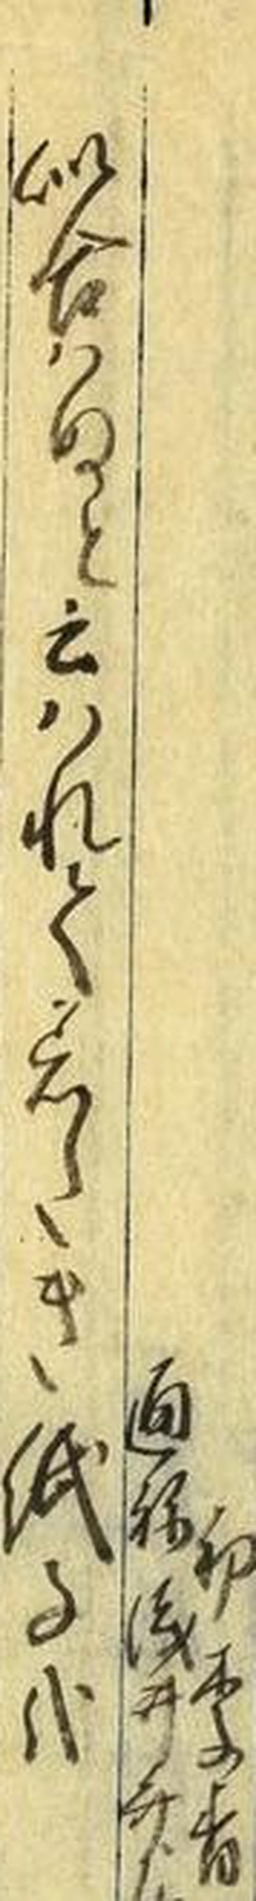似合はぬと言はれて着たき紙子哉
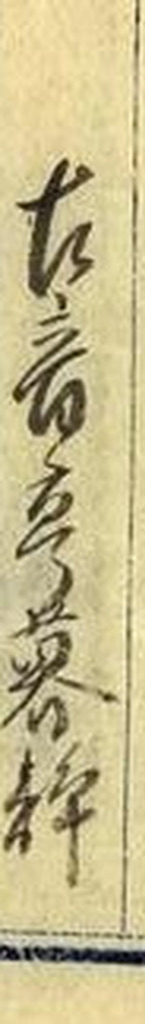古音亭暮静
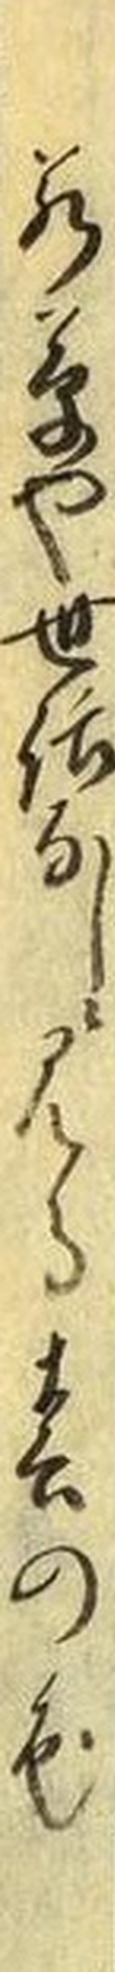若草や世話なしに見る春の色
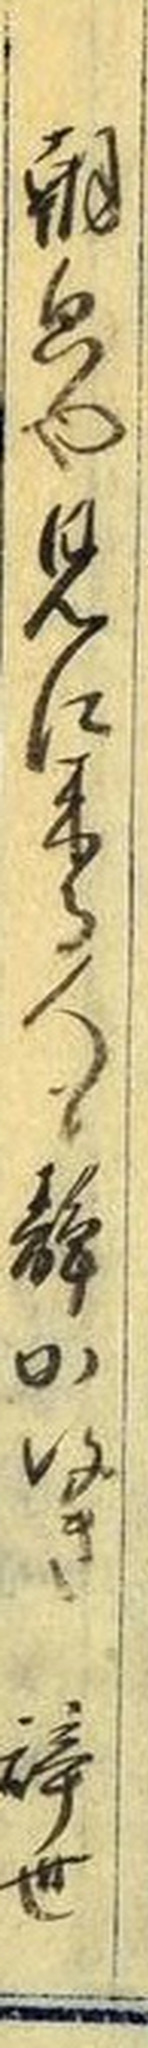朝皃や見に来る人も静かいき辞世

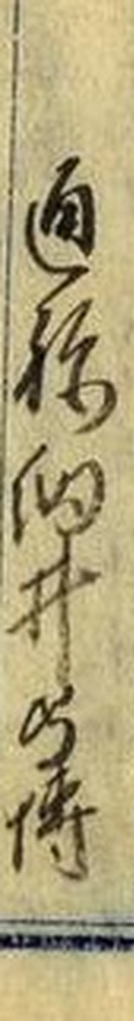通称細井守博
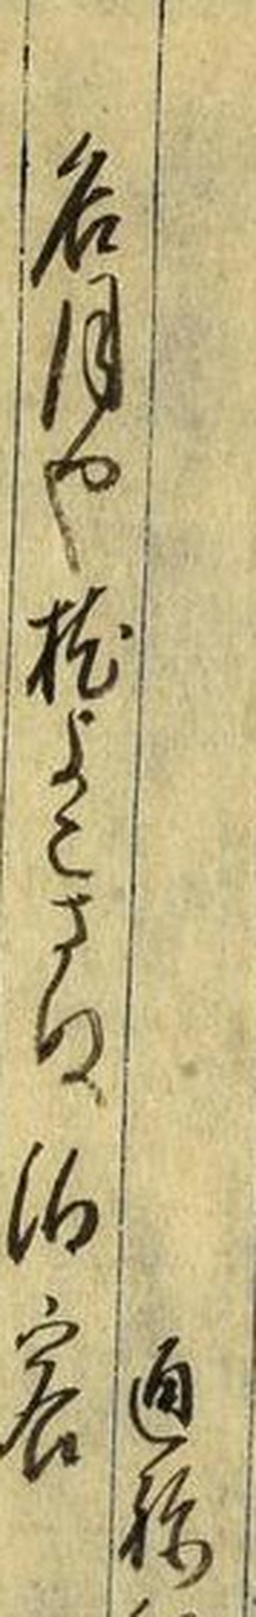名月や枕よこさぬ泊客
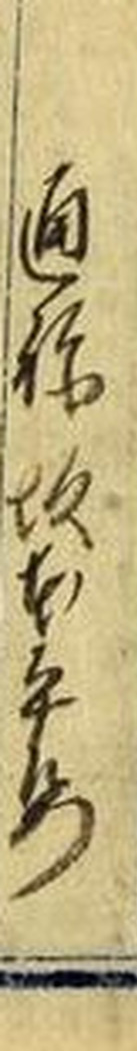通称坂本平左衛門
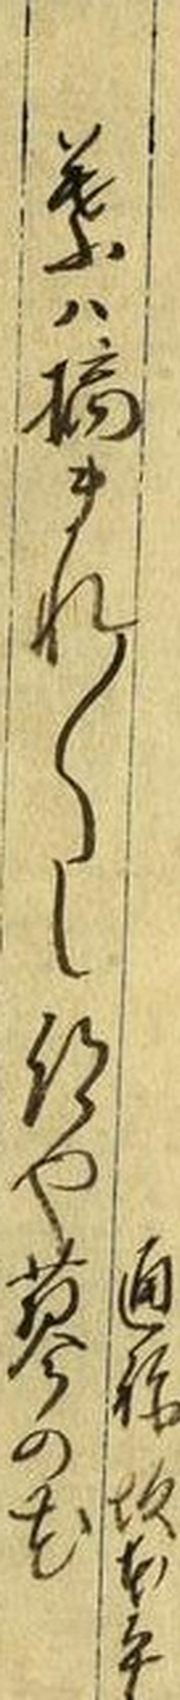葉を摘まれ〳〵し跡や蓼の花
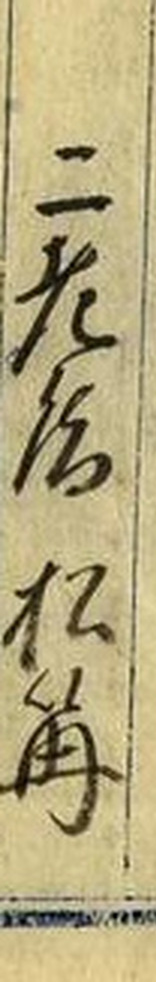二老庵松篝
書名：温古集 三巻
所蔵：福井県文書館 Fukui Prefectural Archives
